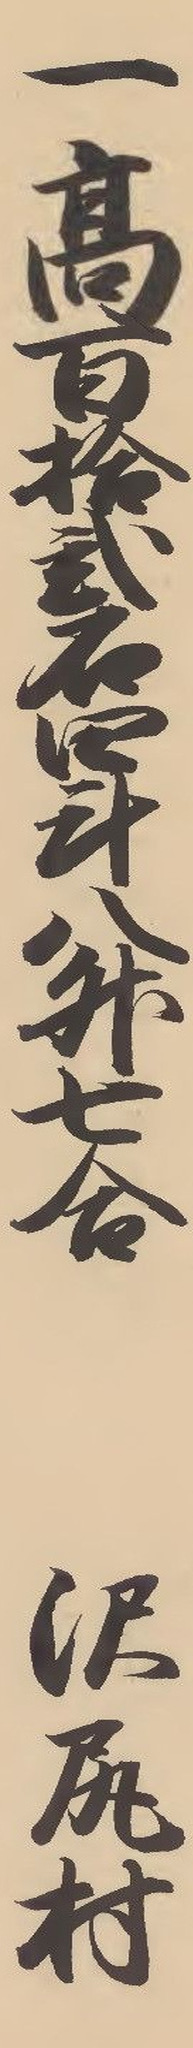一高百拾弐石四斗八升七合沢尻村
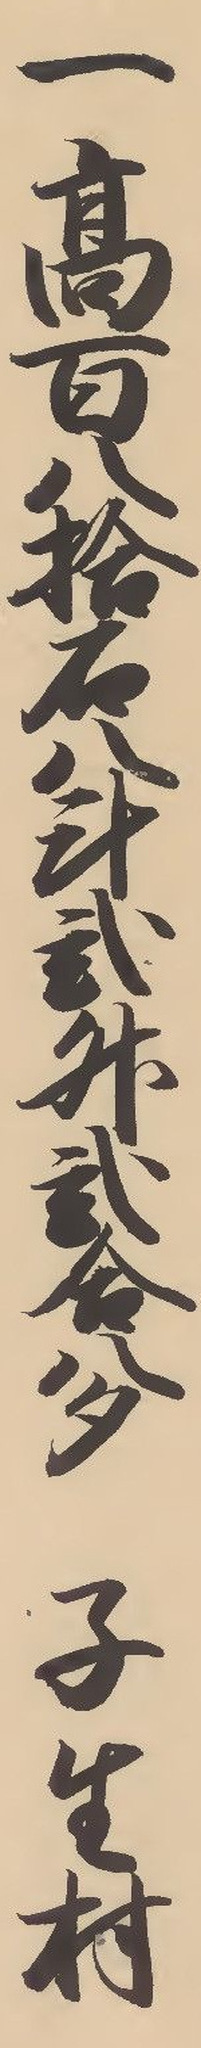一高百八拾石八斗弐升弐合八勺子生村
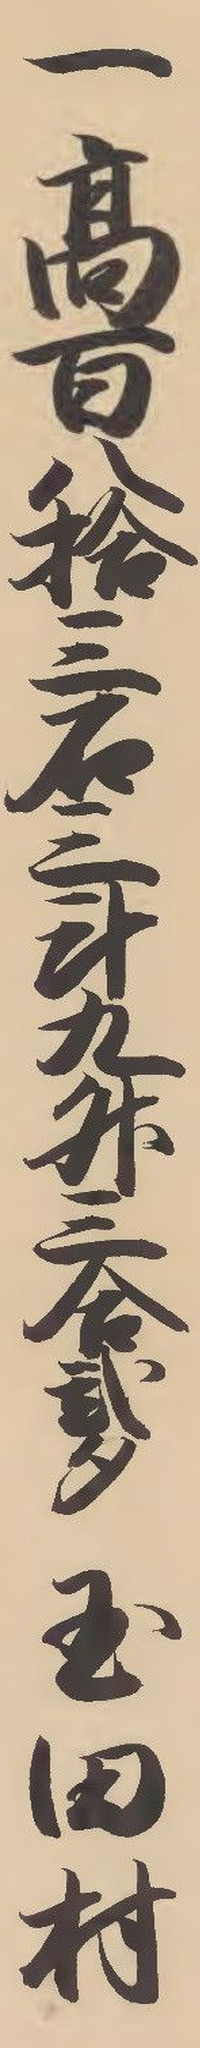一高百八拾三石三斗九升三合弐勺玉田村
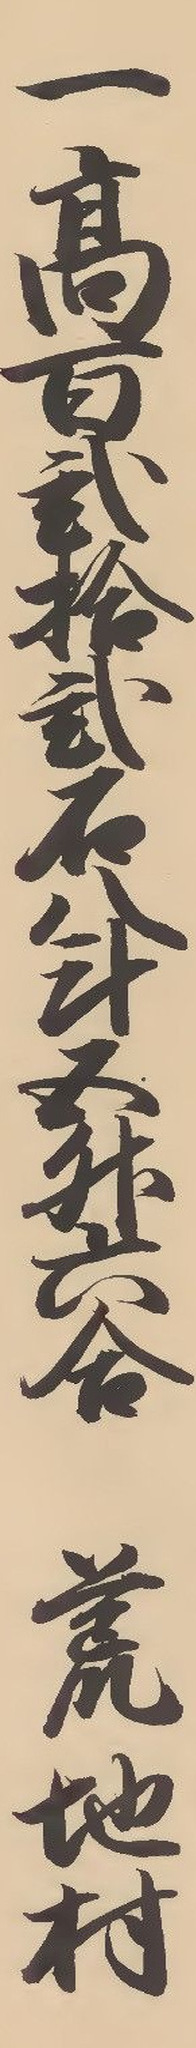一高百弐拾弐石八斗五升六合荒地村
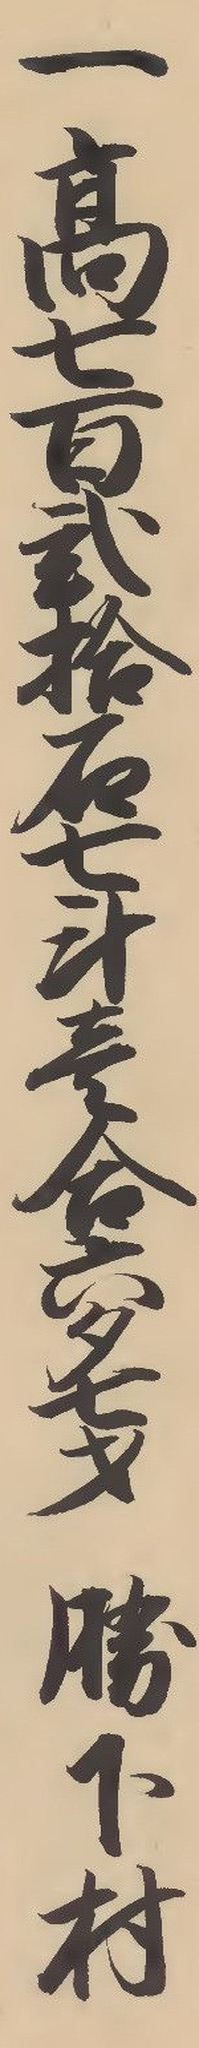一高七百弐拾石七斗壱合六勺七才勝下村
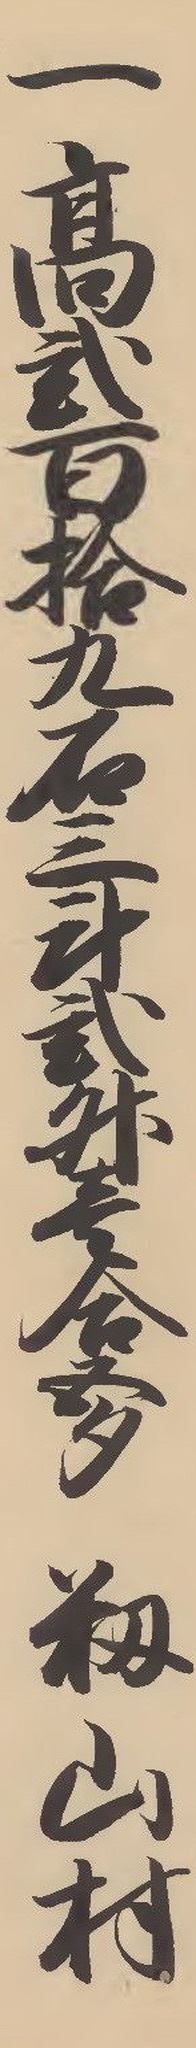一高弐百拾九石三斗弐升壱合五勺籾山村
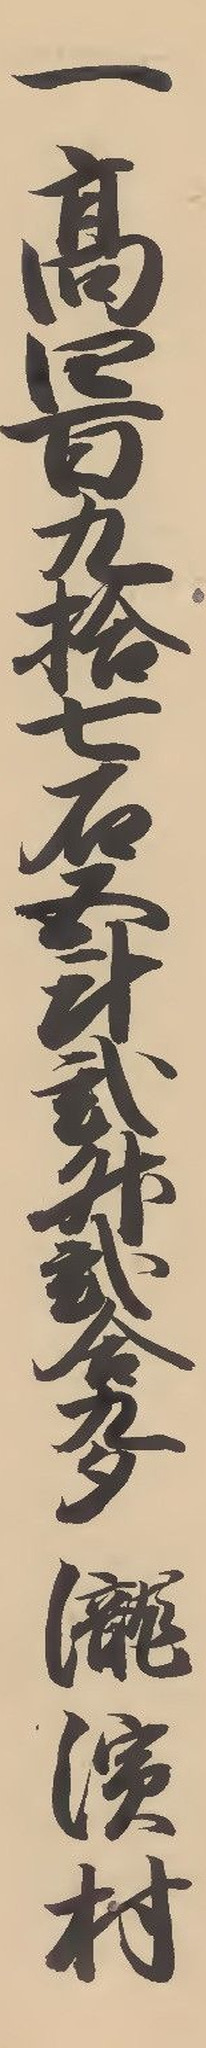一高四百九拾七石五斗弐升弐合九勺滝浜村
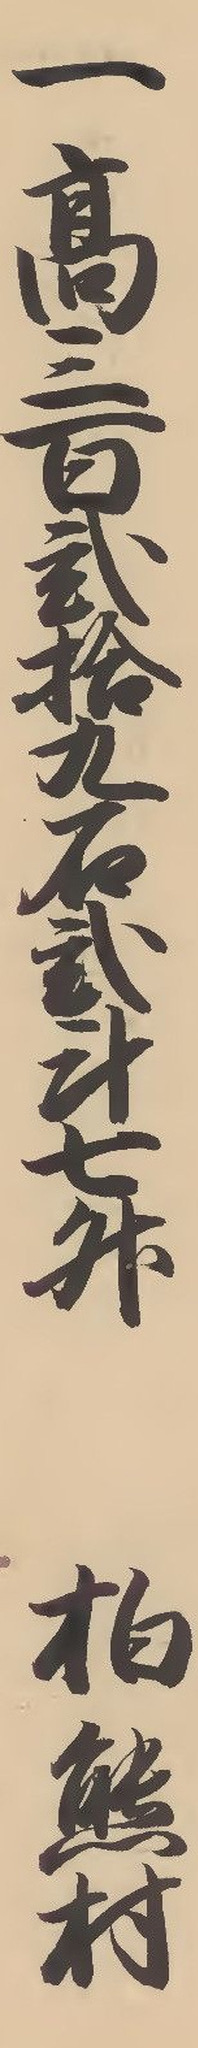一高三百弐拾九石弐斗七升柏熊村

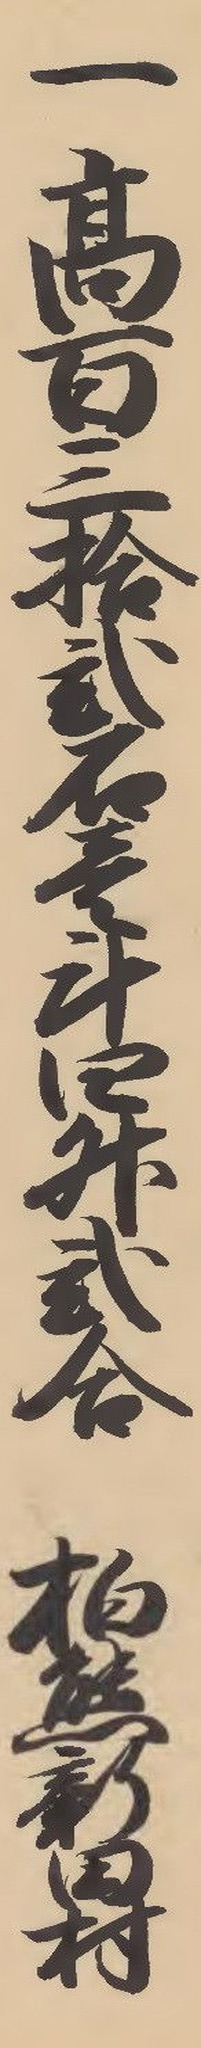一高百三拾弐石壱斗四升弐合柏熊新田村
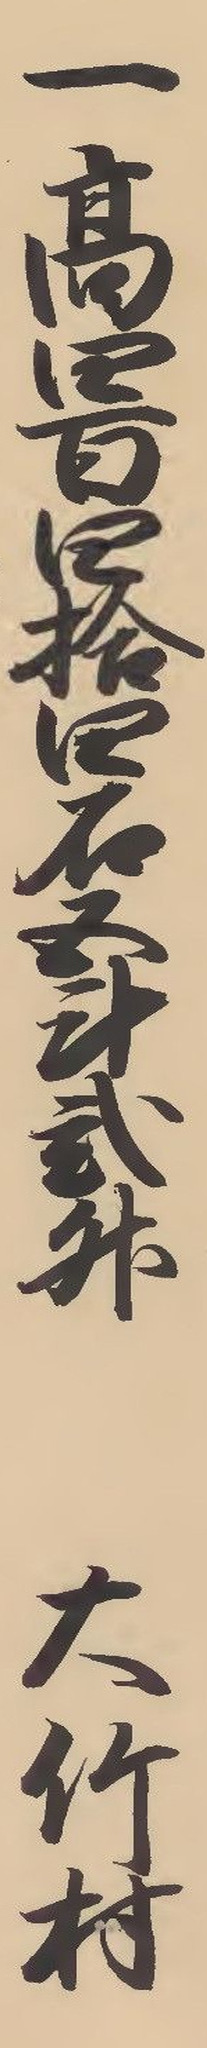一高四百四拾四石五斗弐升大竹村
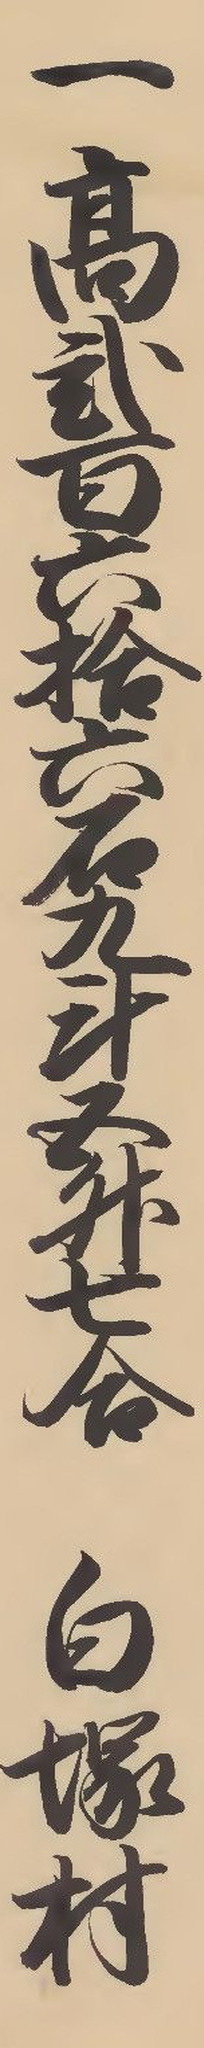一高弐百六拾六石九斗五升七合白塚村
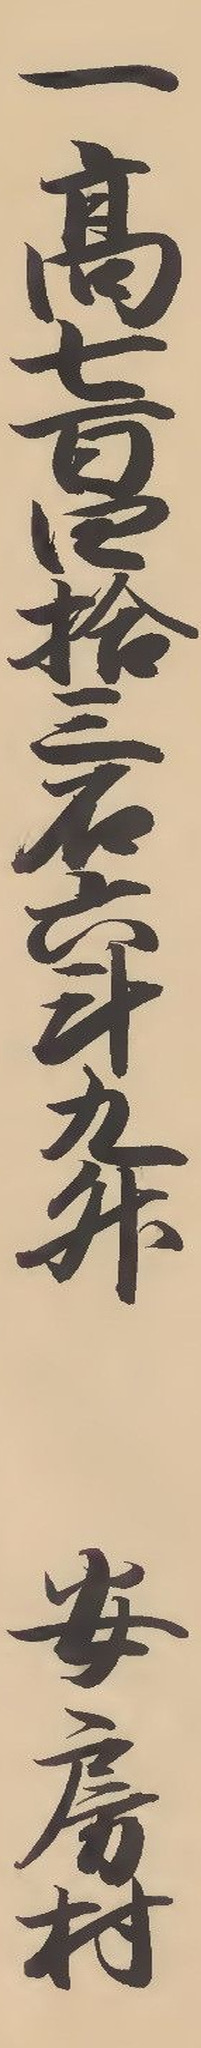一高七百四拾三石六斗九升安房村
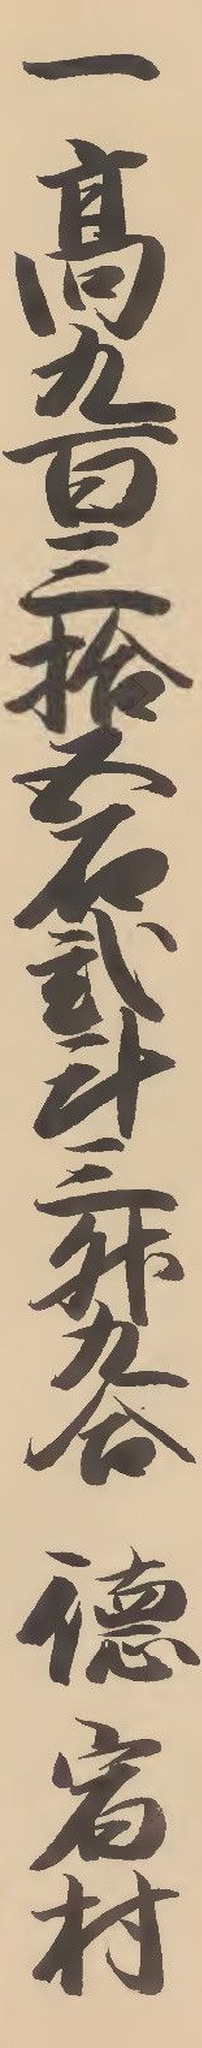一高九百三拾五石弐斗三升九合徳宿村
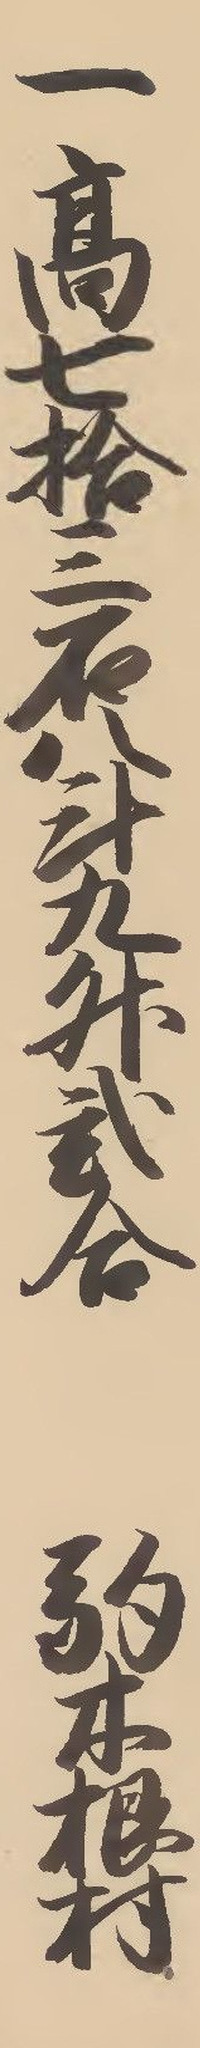一高七拾三石八斗九升弐合駒木根村
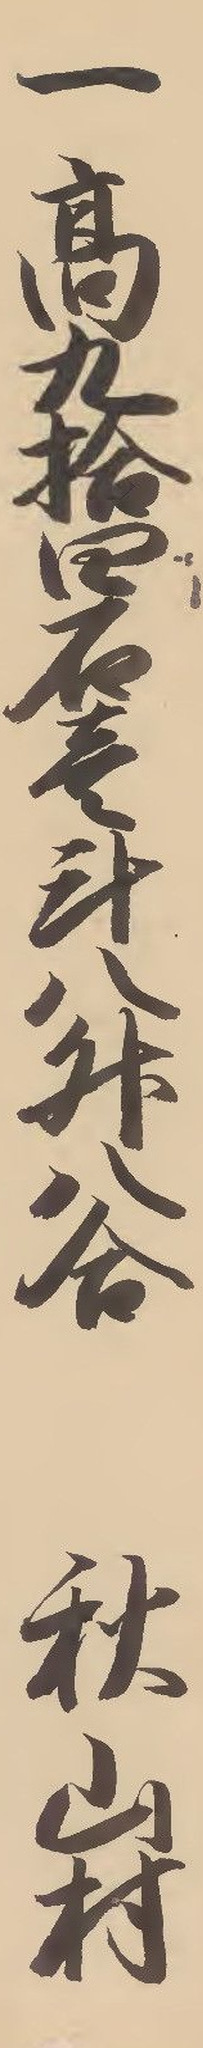一高九拾四石壱斗八升八合秋山村
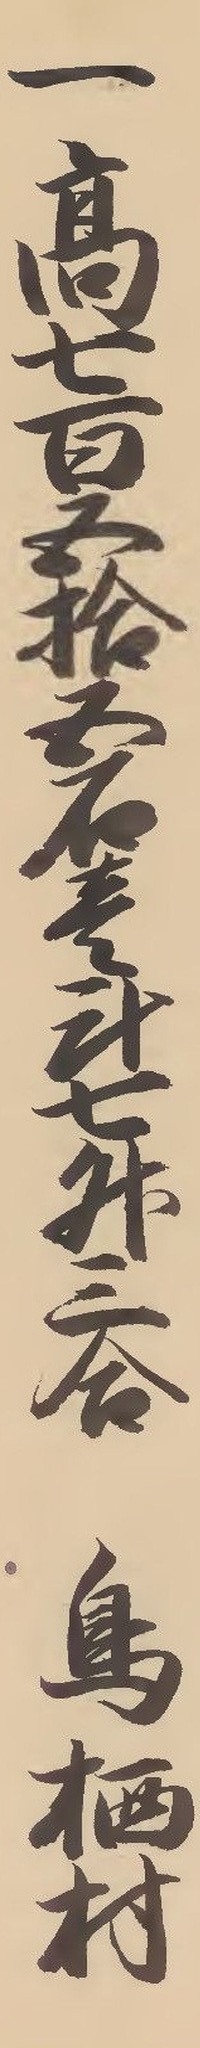一高七百五拾五石壱斗七升三合鳥栖村
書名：常陸国郷帳
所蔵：国立公文書館 National Archives of Japan
